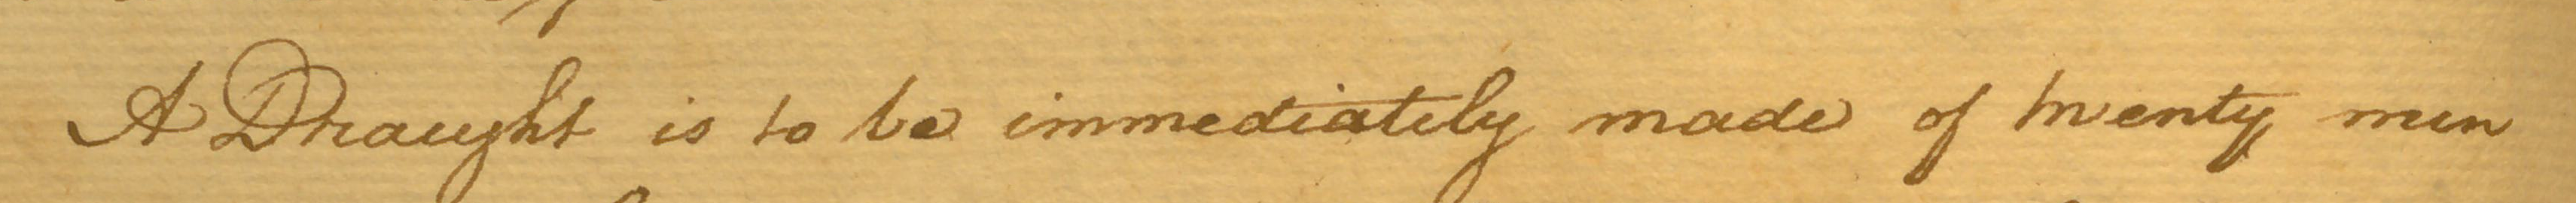A Draught is to be immediately made of twenty men
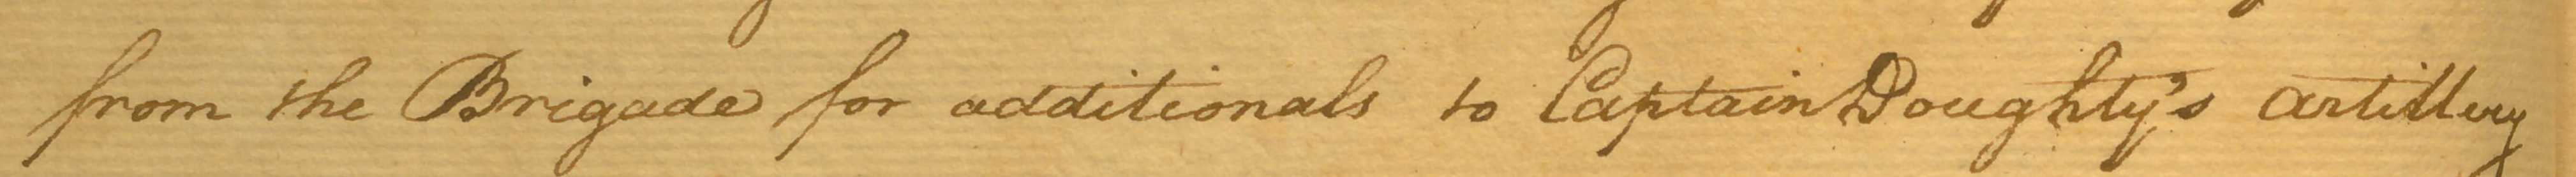from the Brigade for additionals to Captain Doughty's artillery
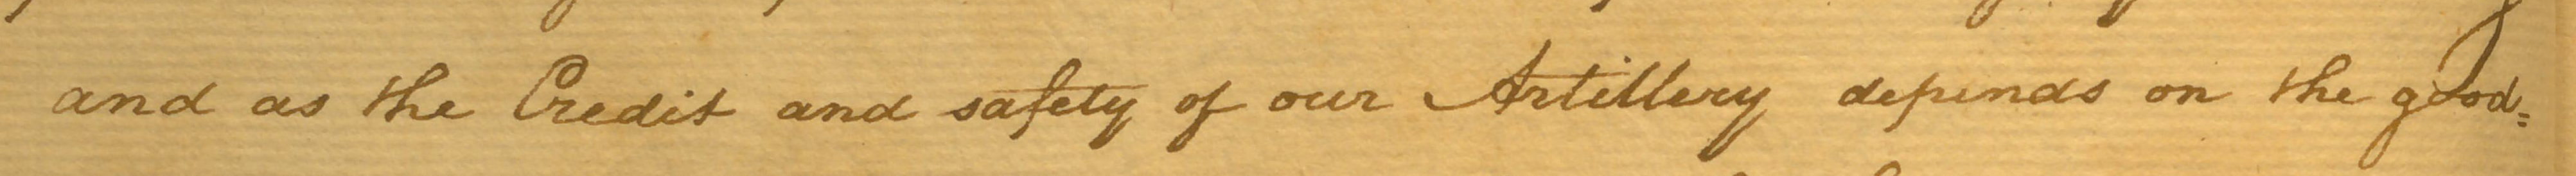and as the Credit and safety of our Artillery depends on the good-
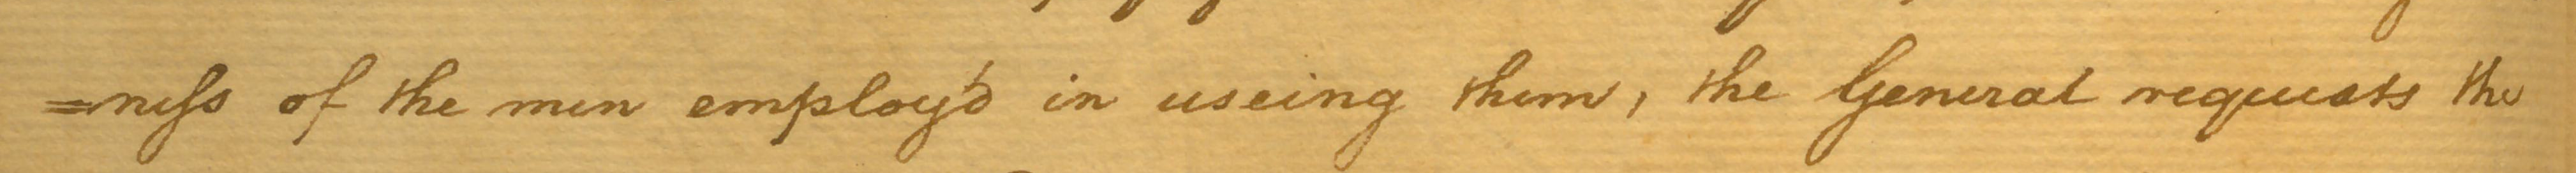-ness of the men employ'd in using them, the General requests the
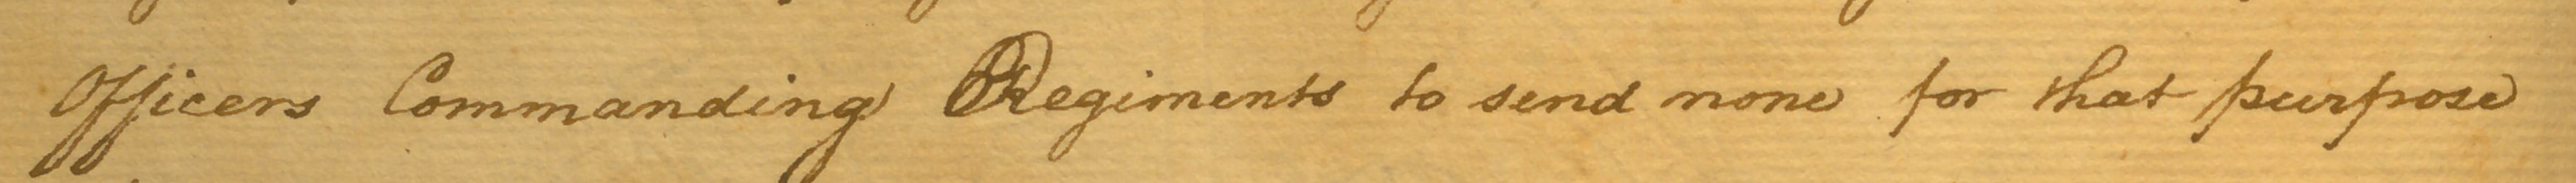Officers Commanding Regiments to send none for that purpose
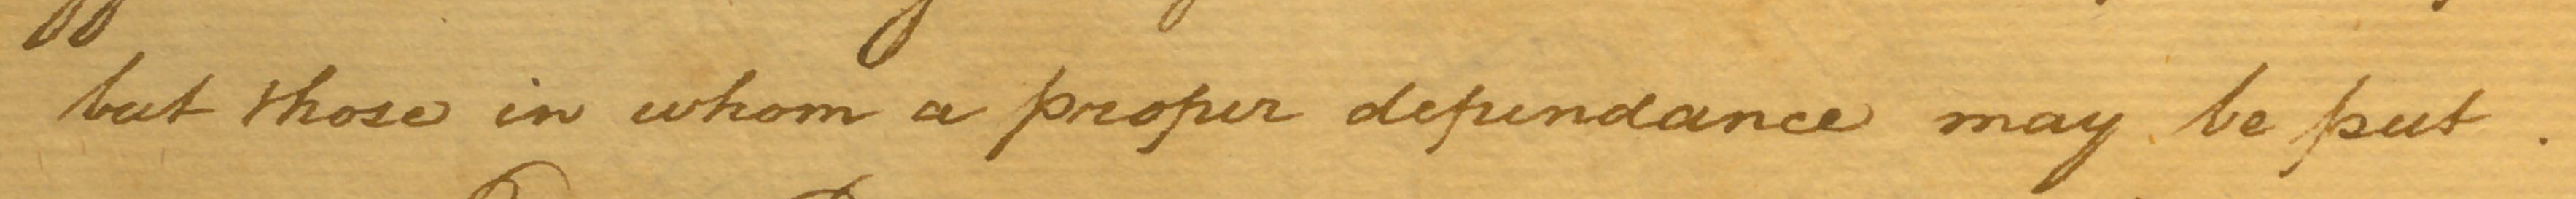but those in whom a proper dependance may be put.
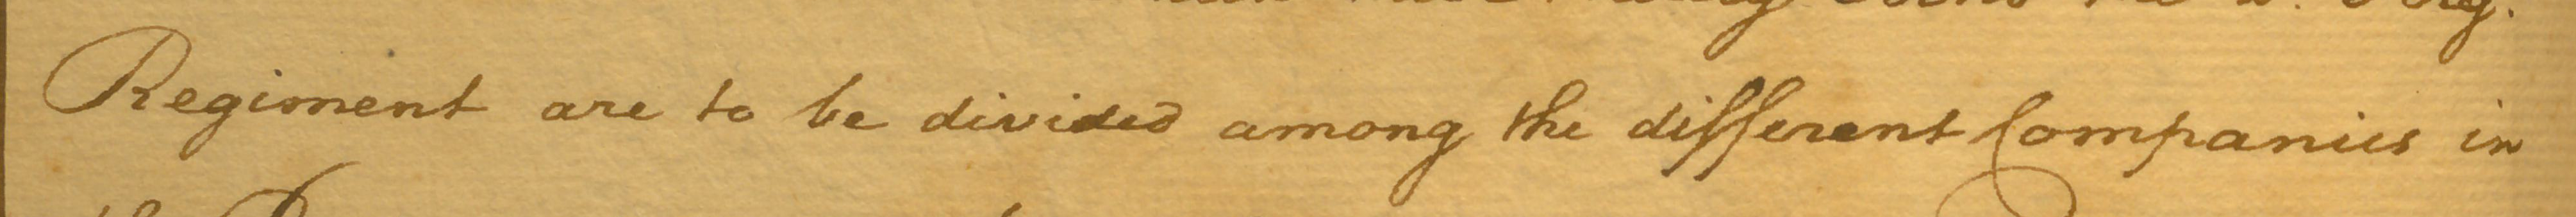Regiment are to be divided among the different Companies in
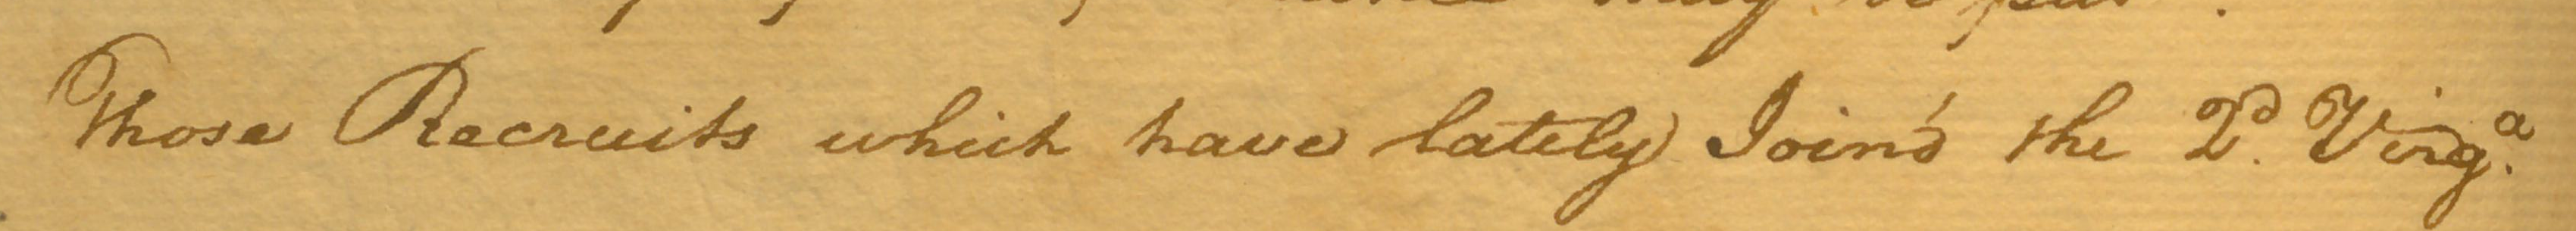Those Recruits which have lately Join'd the 2^d. Virg^a.
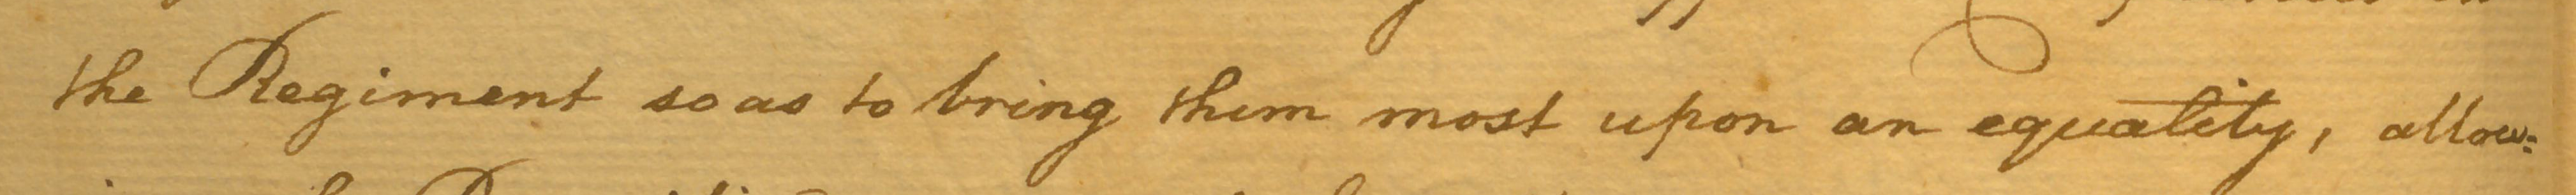the Regiment so as to bring them most upon an equality, allow-
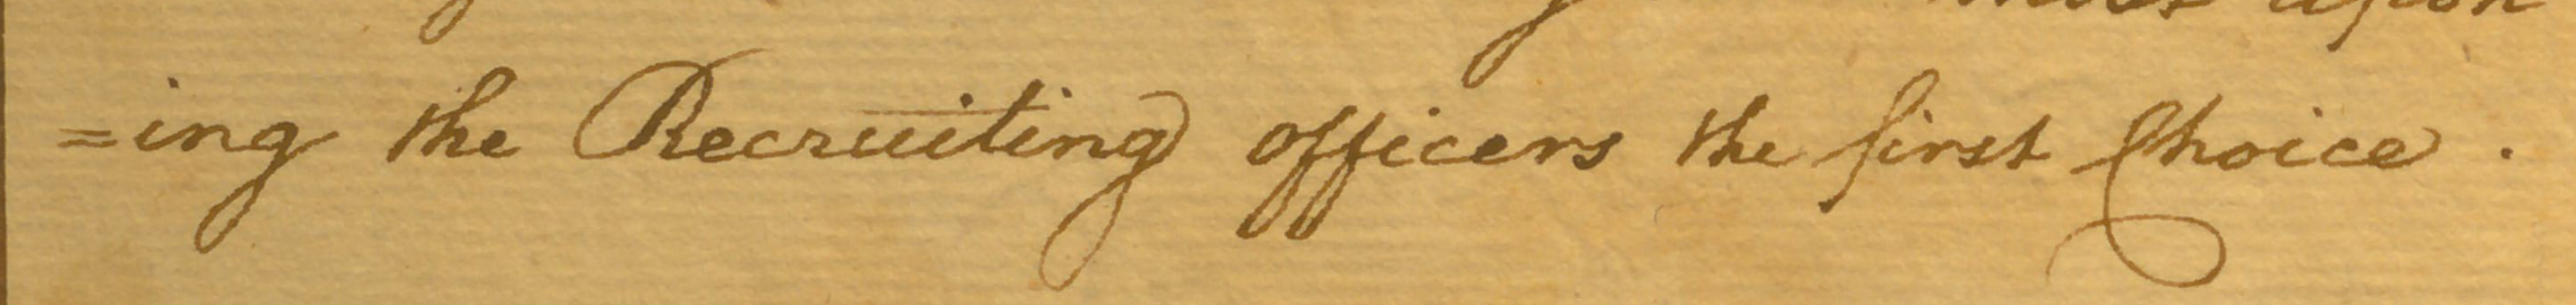-ing the Recruiting officers the first Choice.
